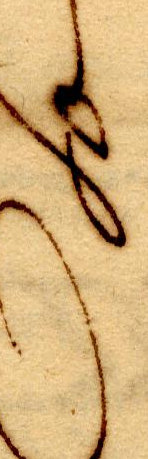To
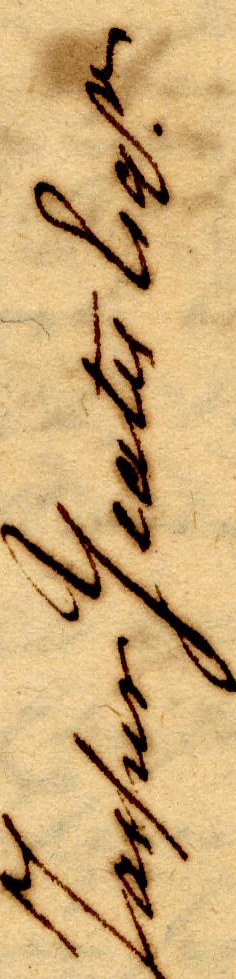Jasper Yeates Esq^r.
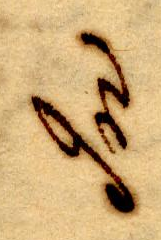In
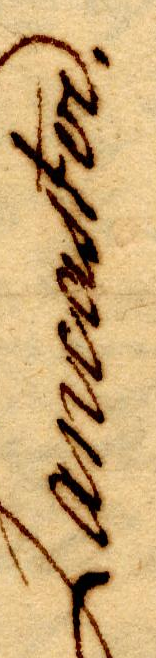Lancaster.
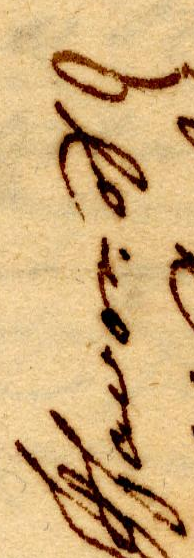By Favor of
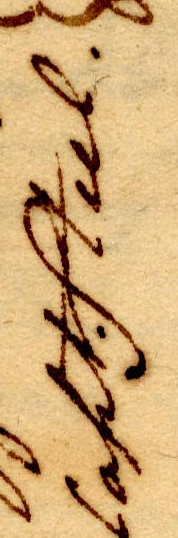Capt. Steel.
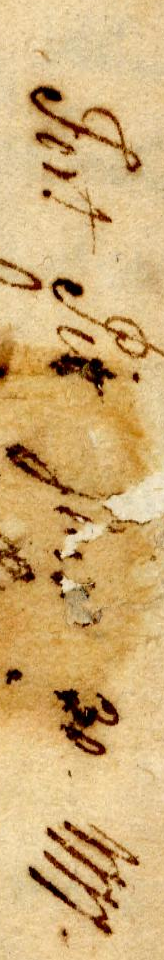Fort Pit June 30. 1777.
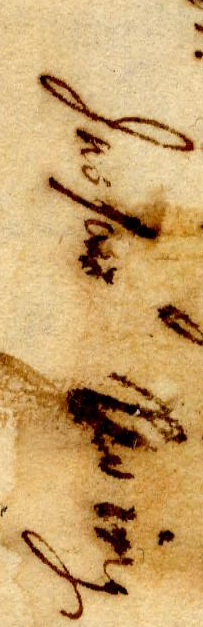Jasper Ewing
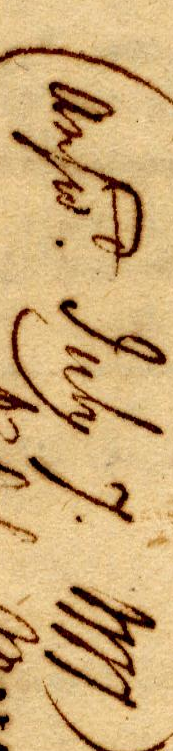(Answ^d. July 7. 1777)
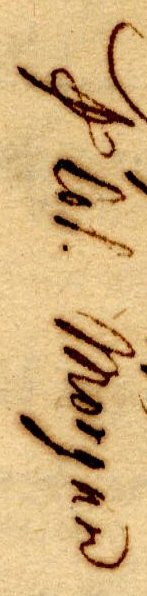per Col. Morgan
